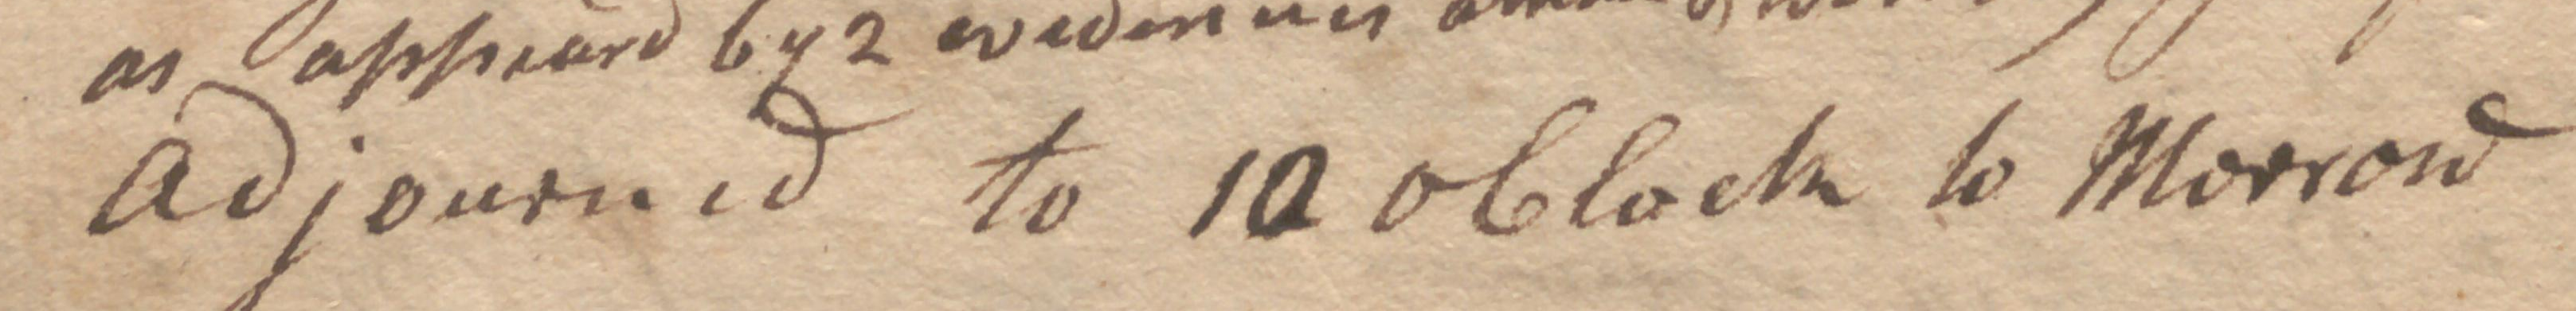adjourned to 10 oClock to Morrow
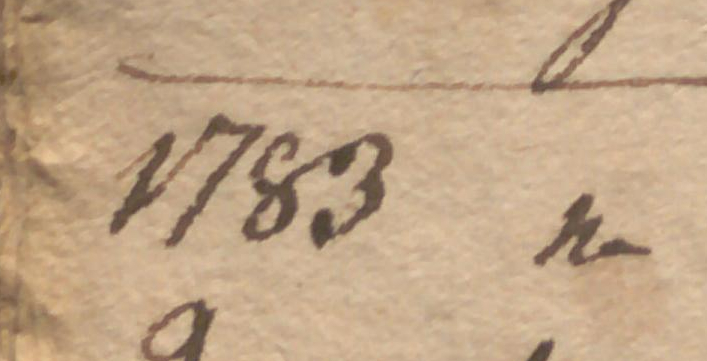1783
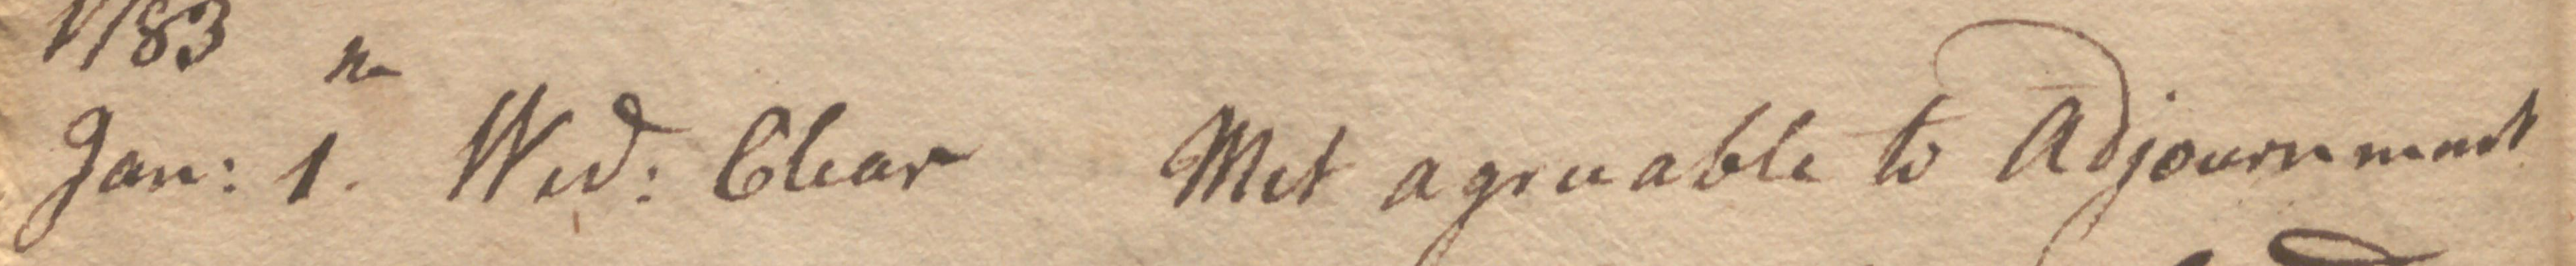Jan: 1^th. Wed. Clear Met agreeable to Adjournment
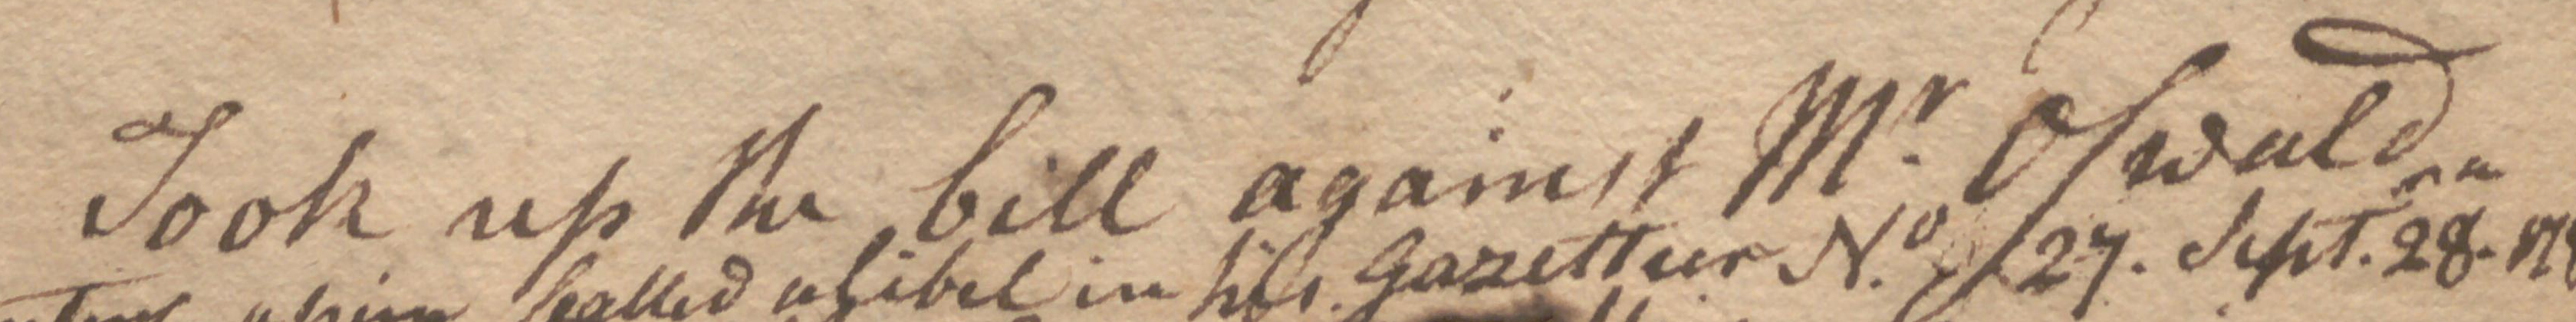Took up the bill against M^r. Oswald
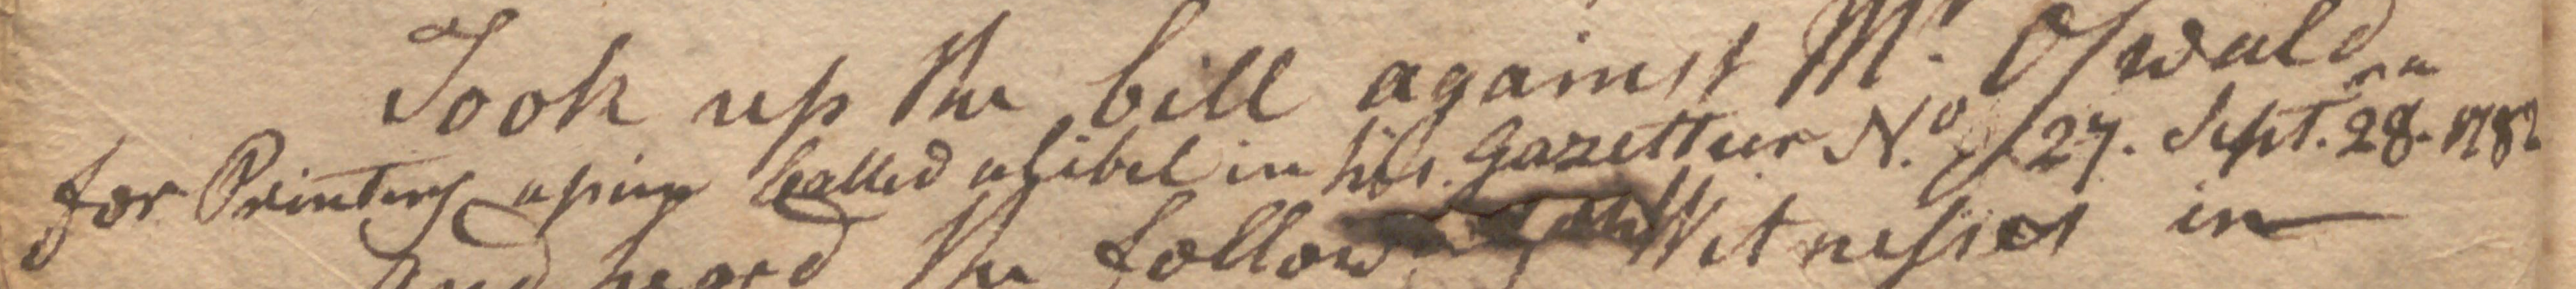for Printing, apin Called a libel in his Gazetteer N^o. 27. Sept^r. 28^th. 1782
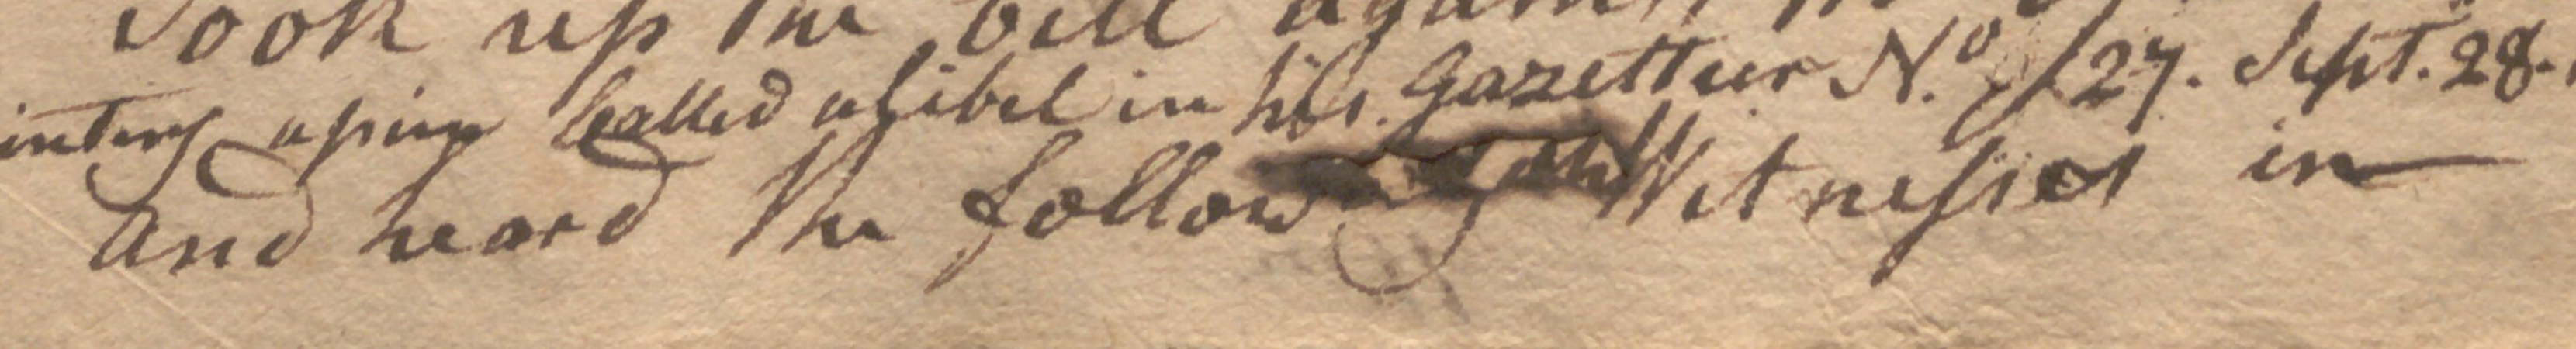and heard the following Witnesses in
